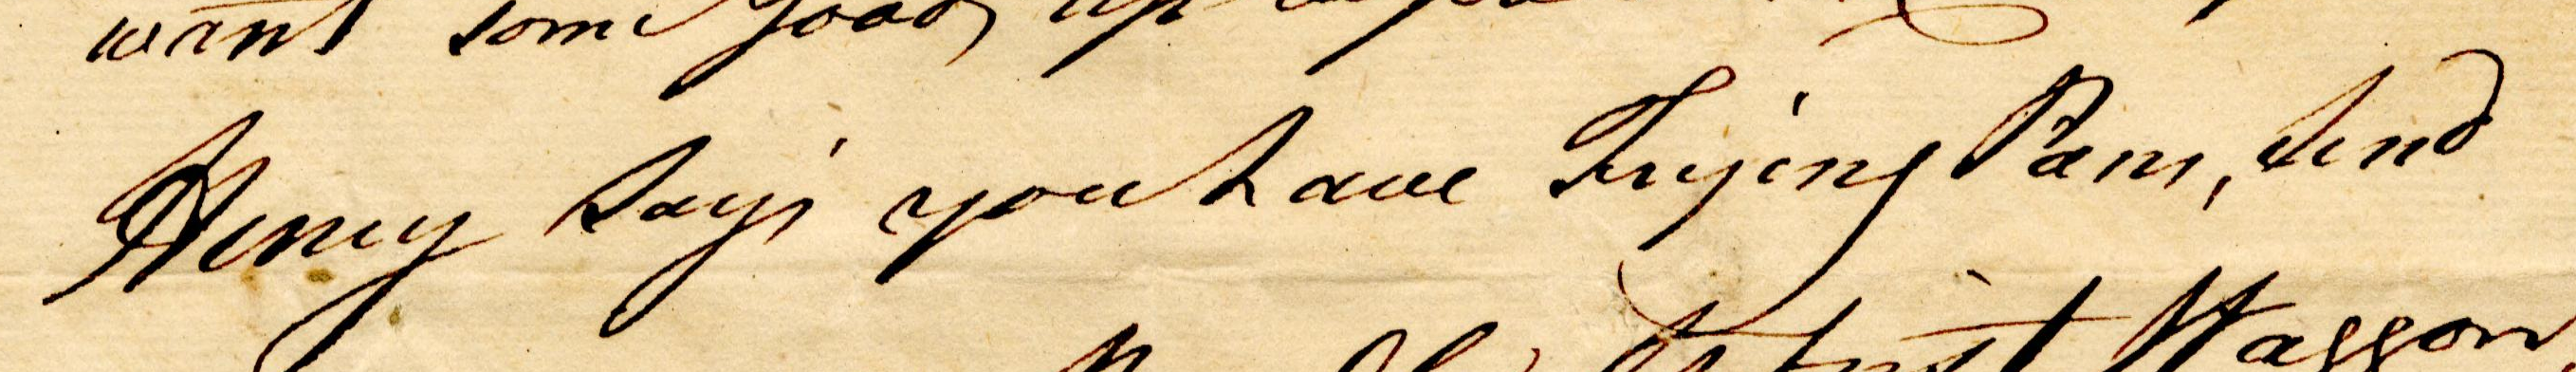Henry says you have Frying Pans, send
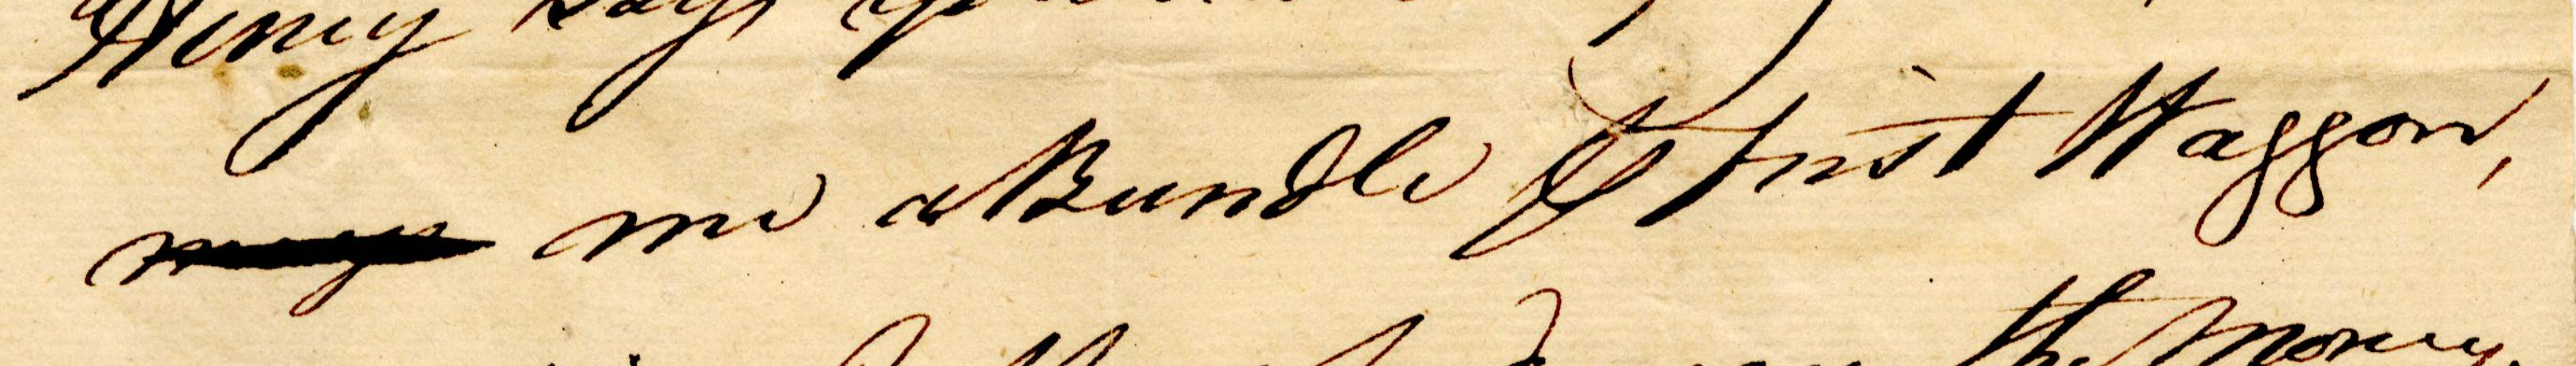[___] me a bunble per first Waggon,
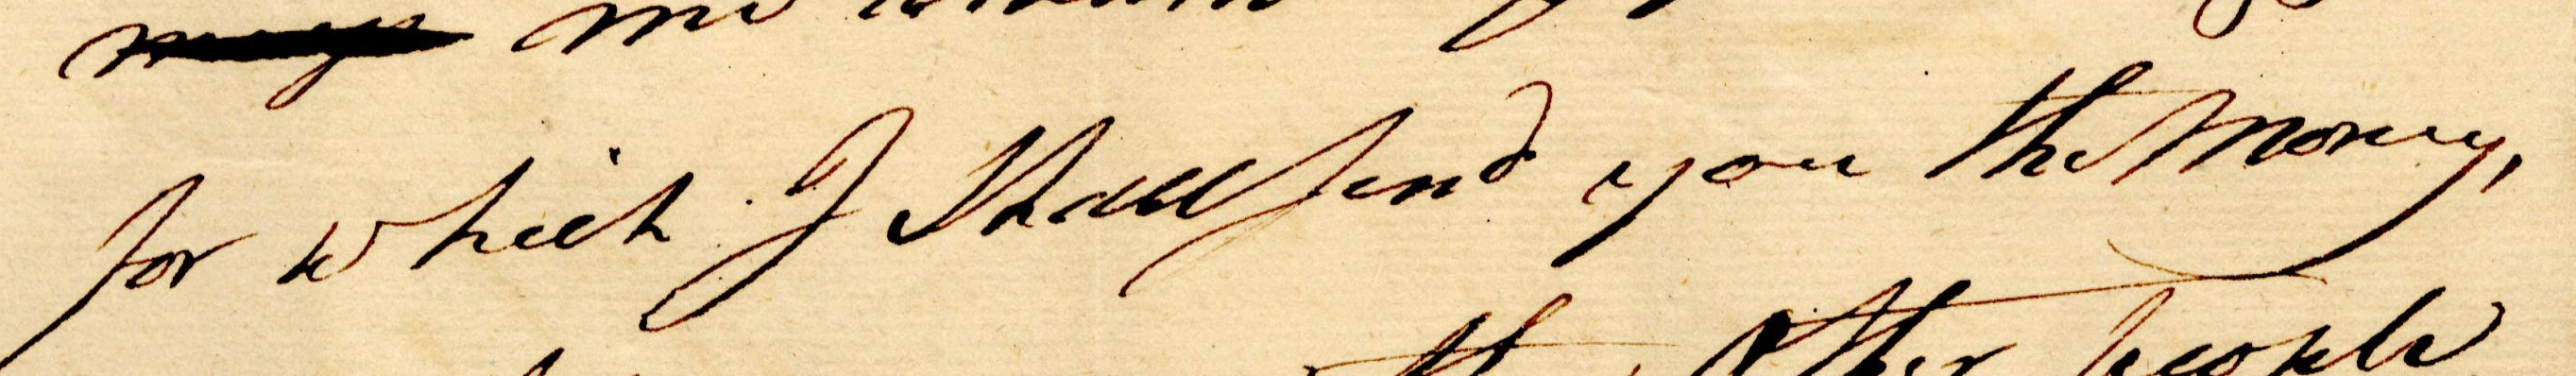for which I Shall Send you the money,
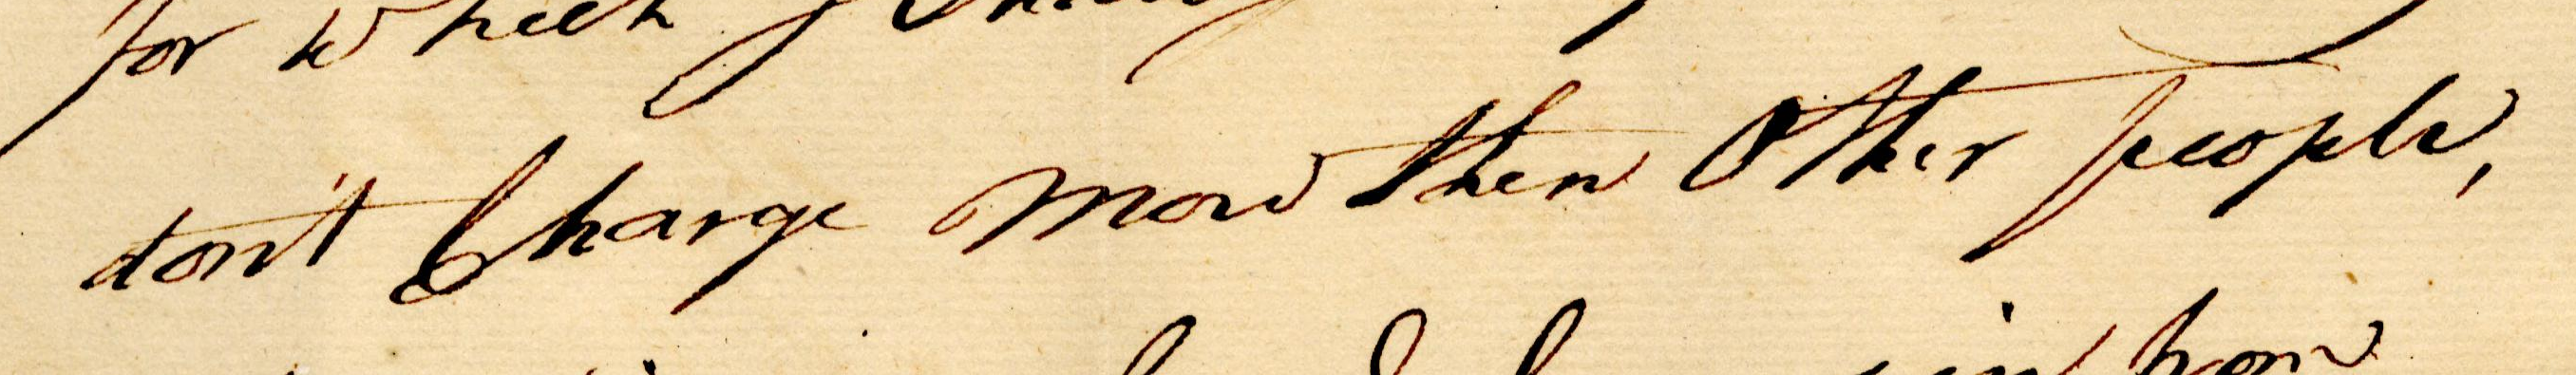don't Charge more then Other people,
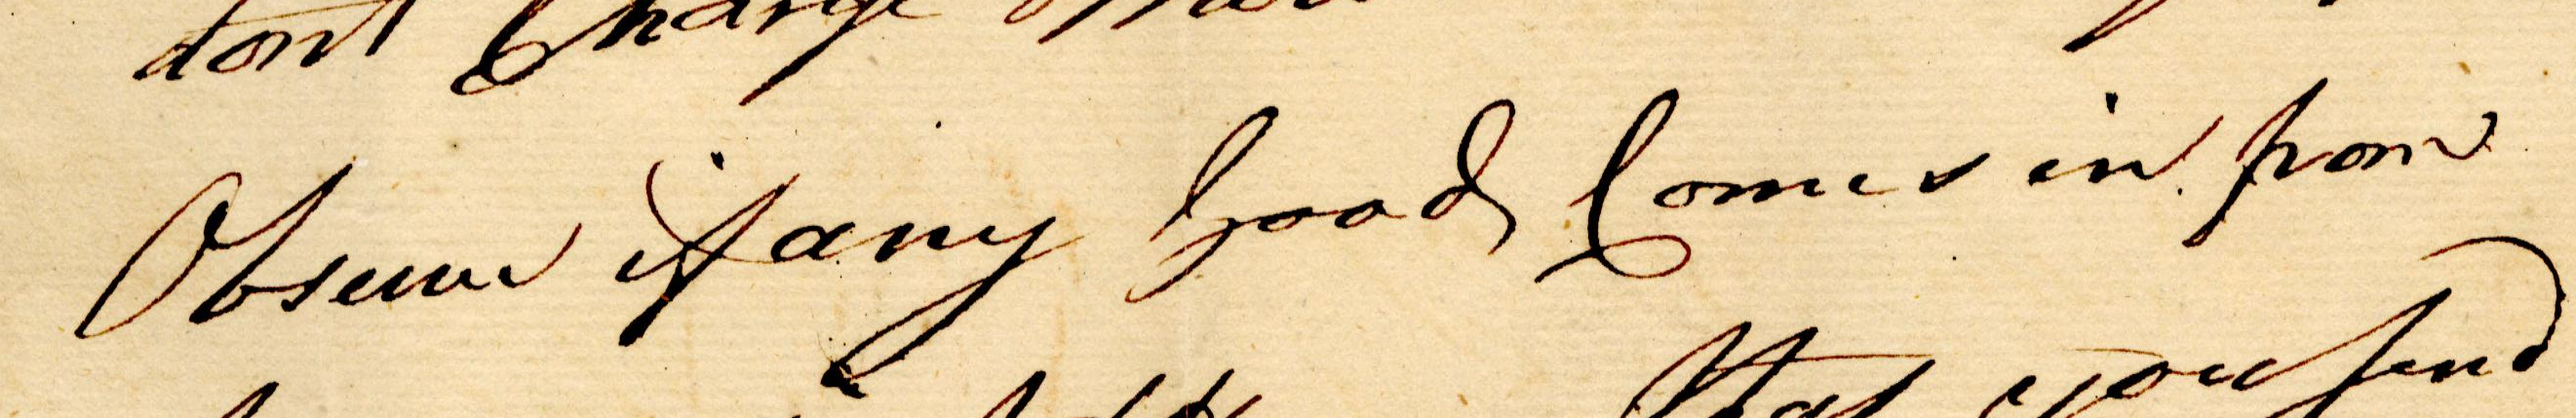Observe if any Goods Comes in from
